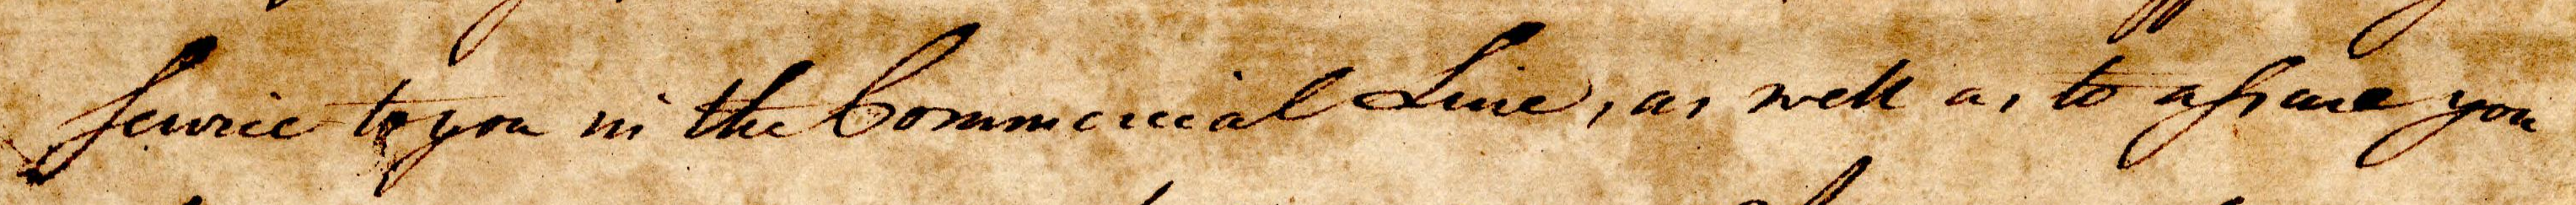Service to you in the Commercial Line, as well as to assure you
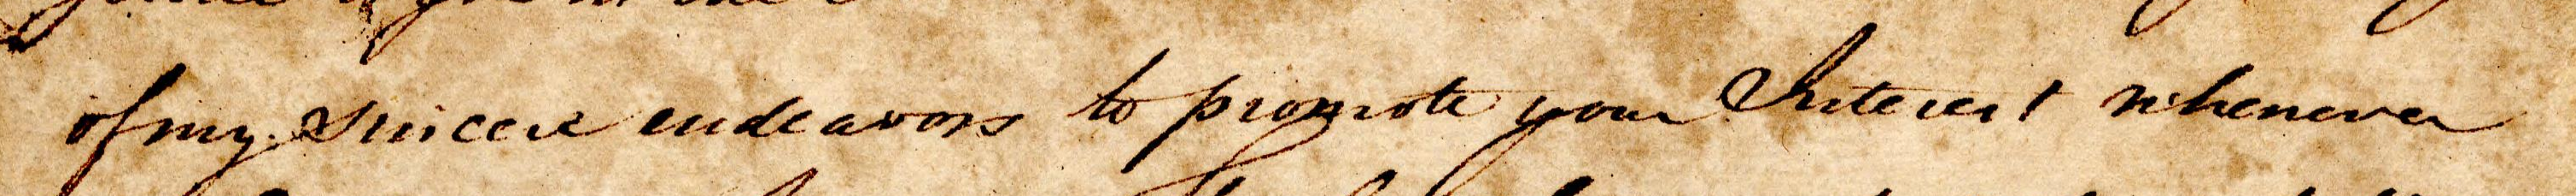of my sincere endeavors to promote your Interest whenever
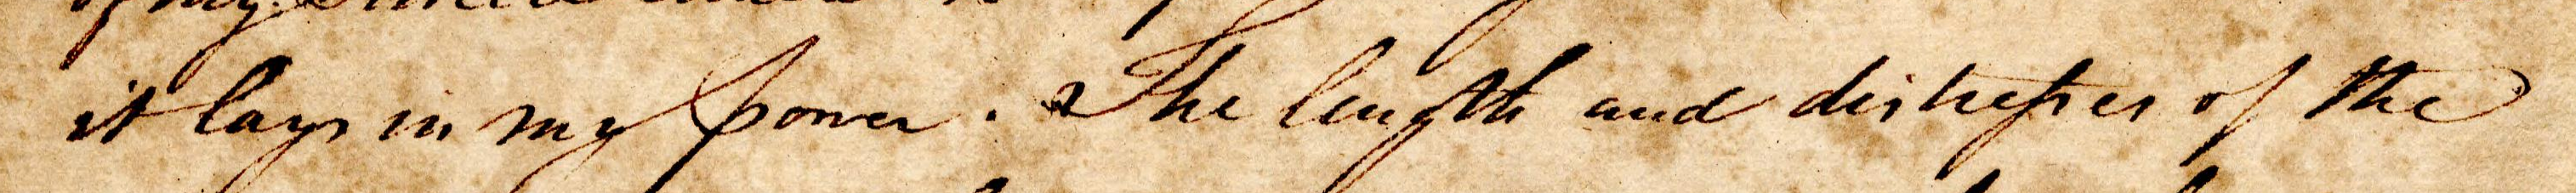it lays in my power. The length and distresses of the
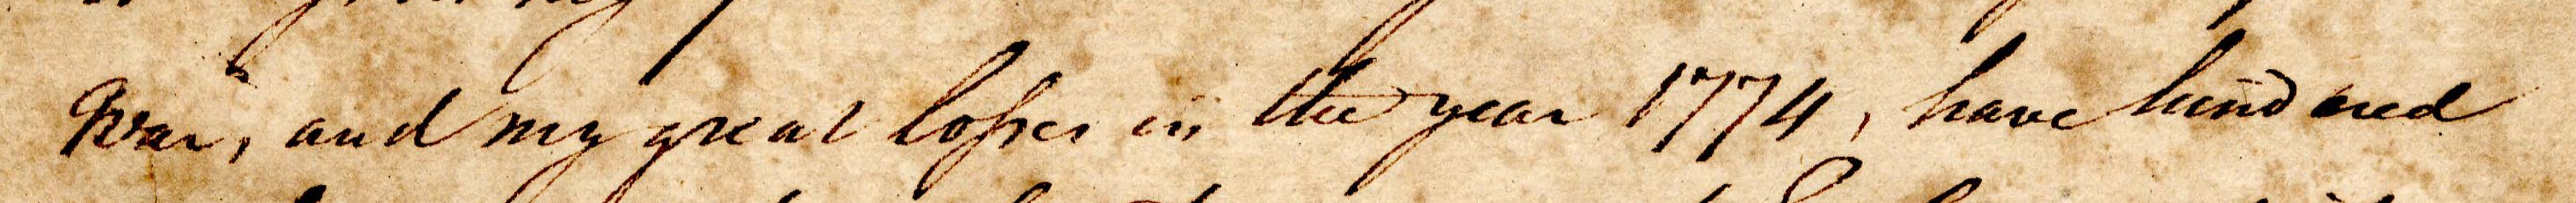war, and my great losses in the year 1774, have hindered
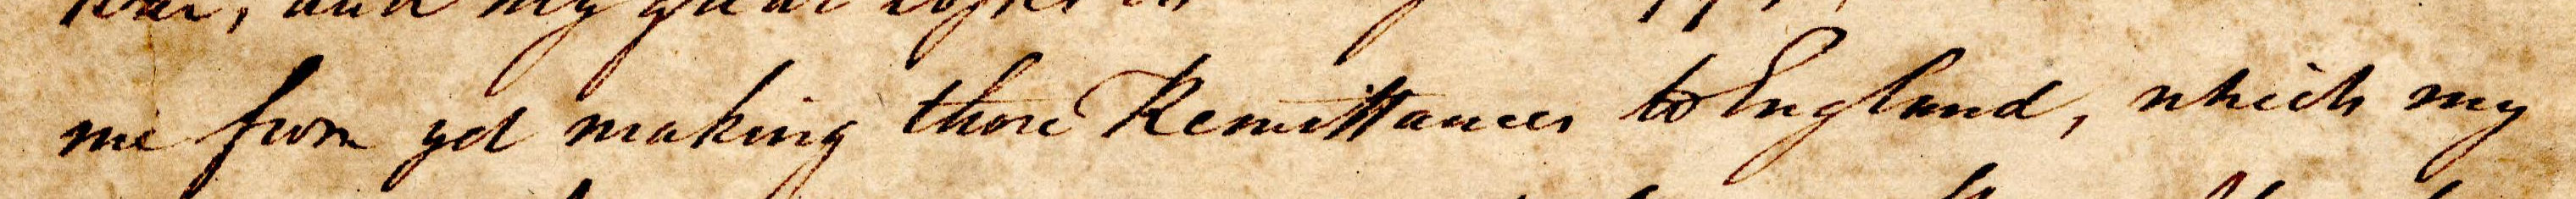me from yet making those Remittances to England, which my
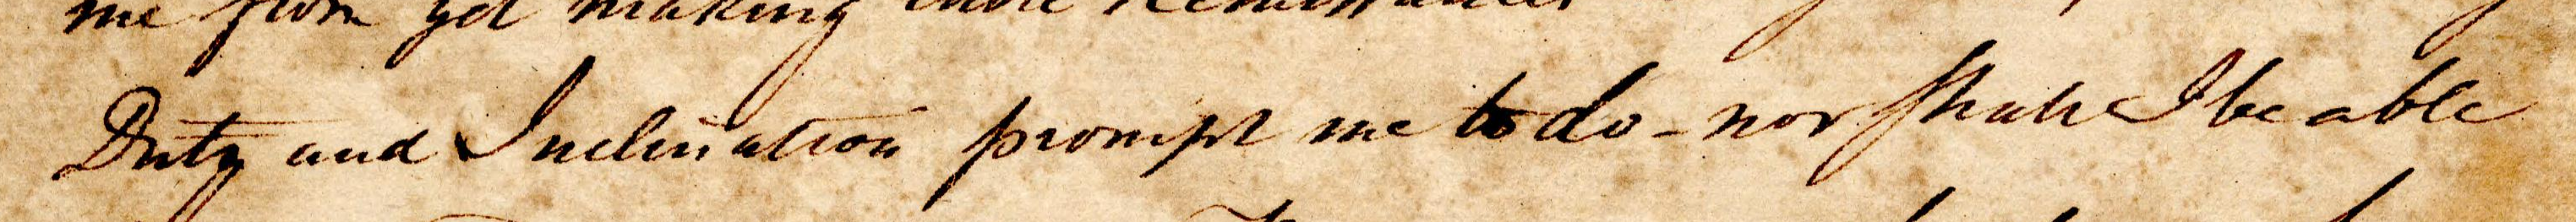Duty and Inclination prompt me to do- nor shall I be able
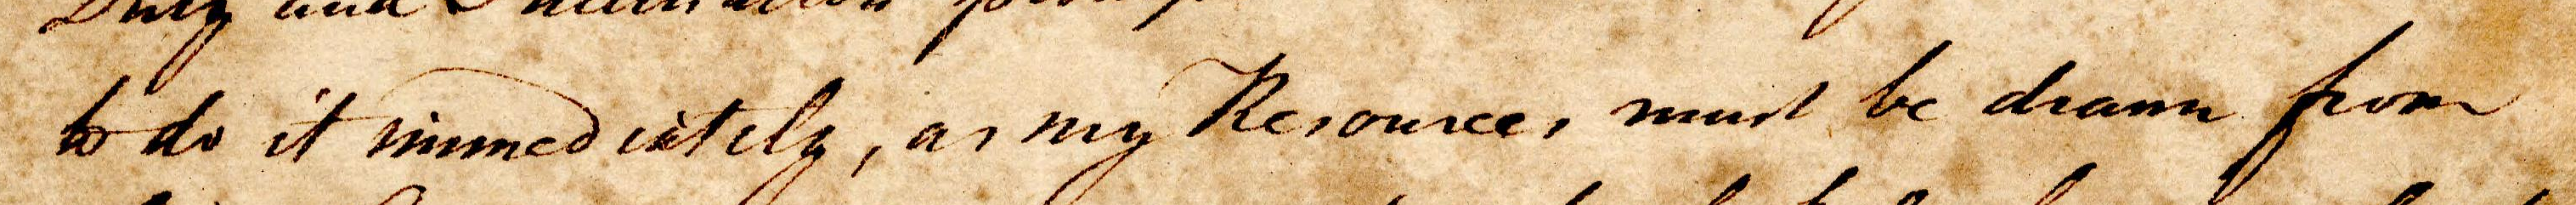to do it immediately, as my Resource, must be drawn from
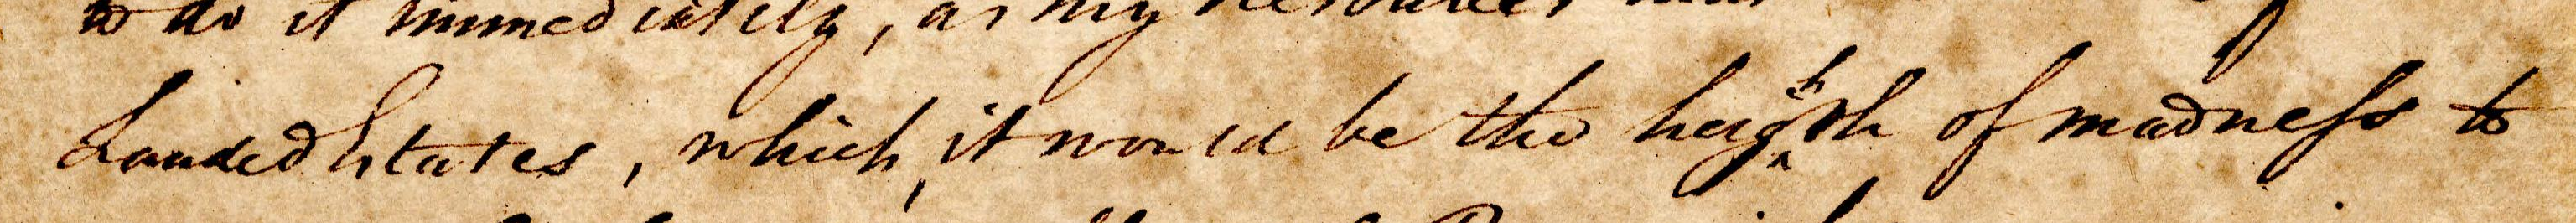Landed Estates, which it would be the heig^hth of madness to
